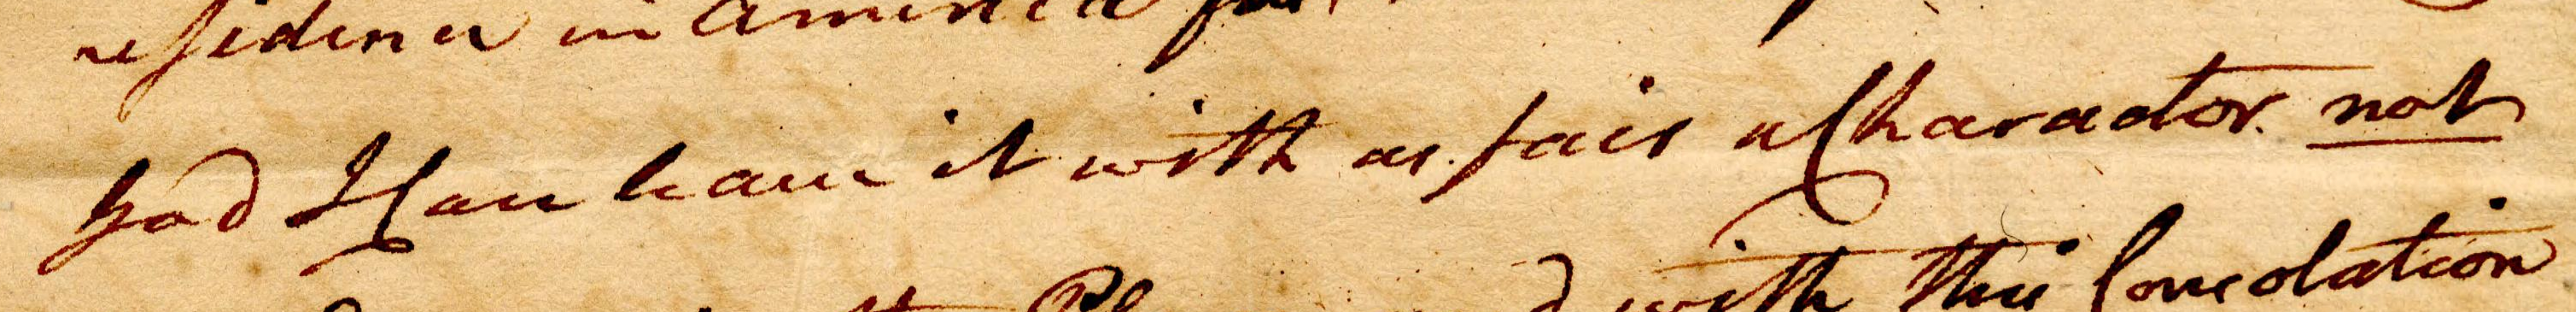God I can leave it with as fair a Character not
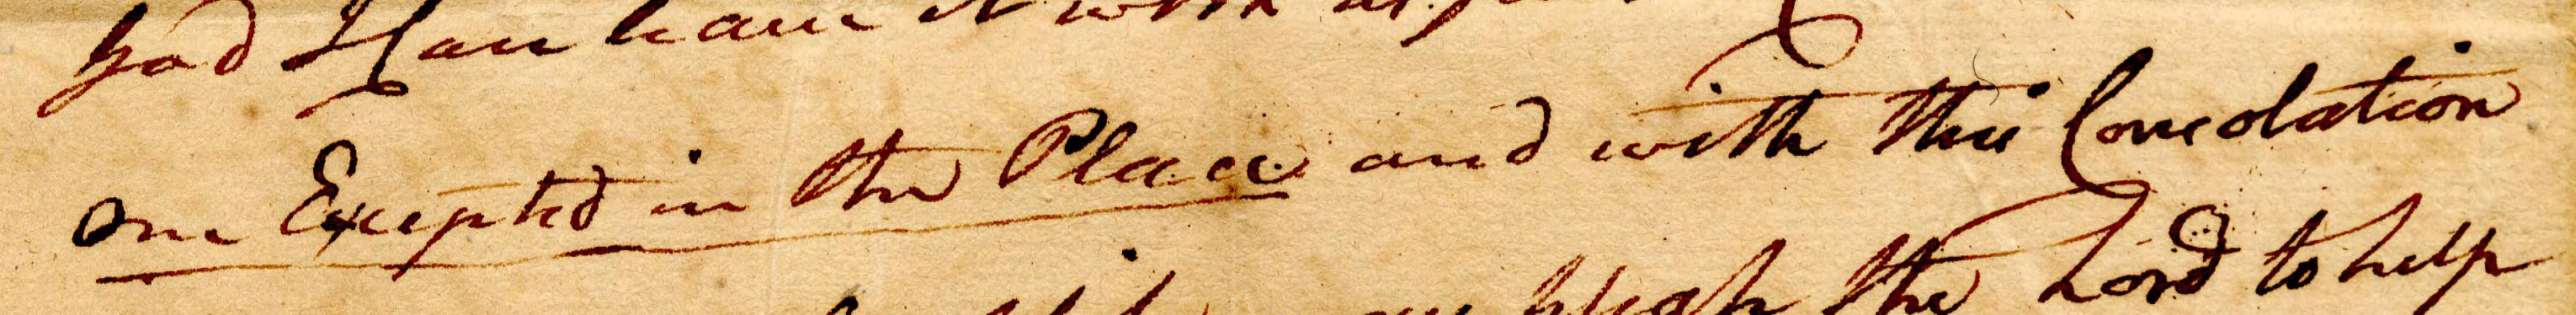one Excepted in the Place and with this Consolation
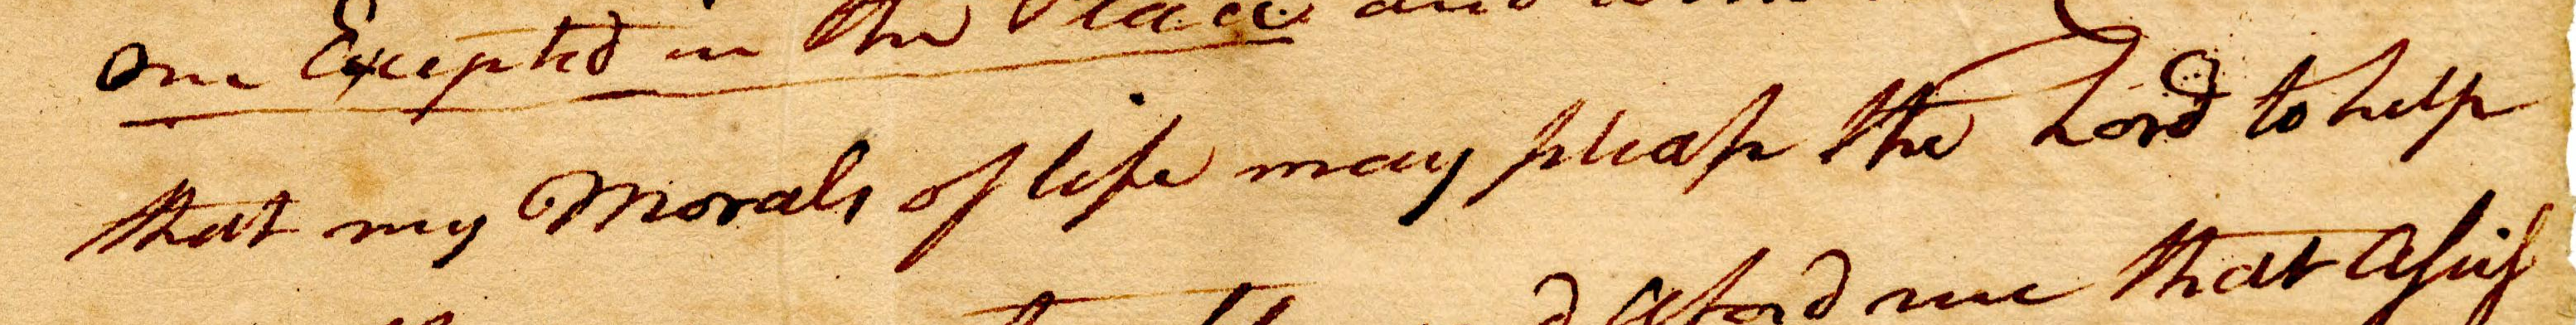that my morals of life may please the Lord to help
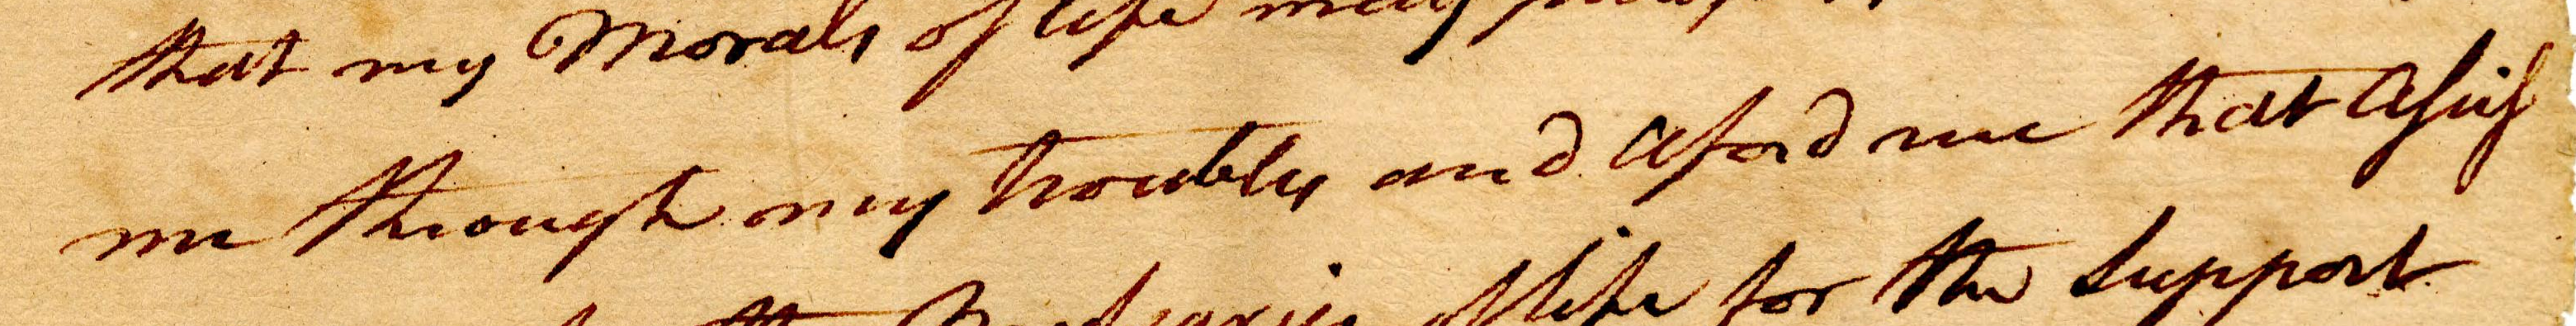me though my troubles and Aford me that Assis-
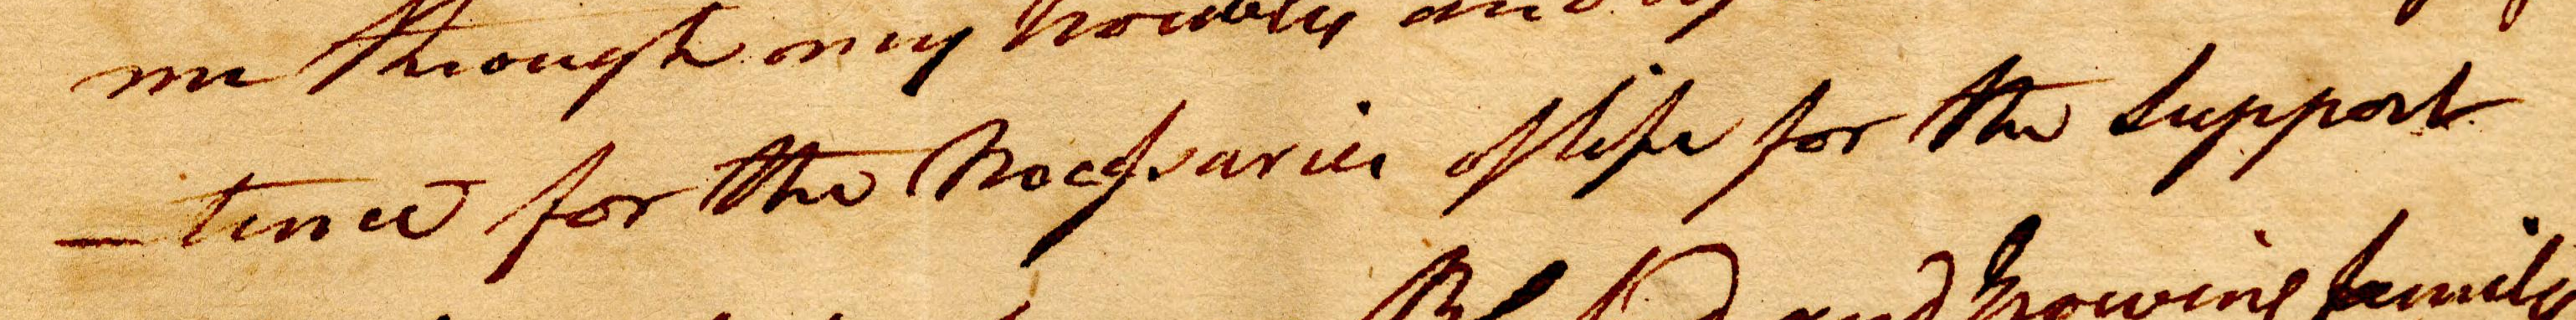-tence for the Necessaries of life for the support
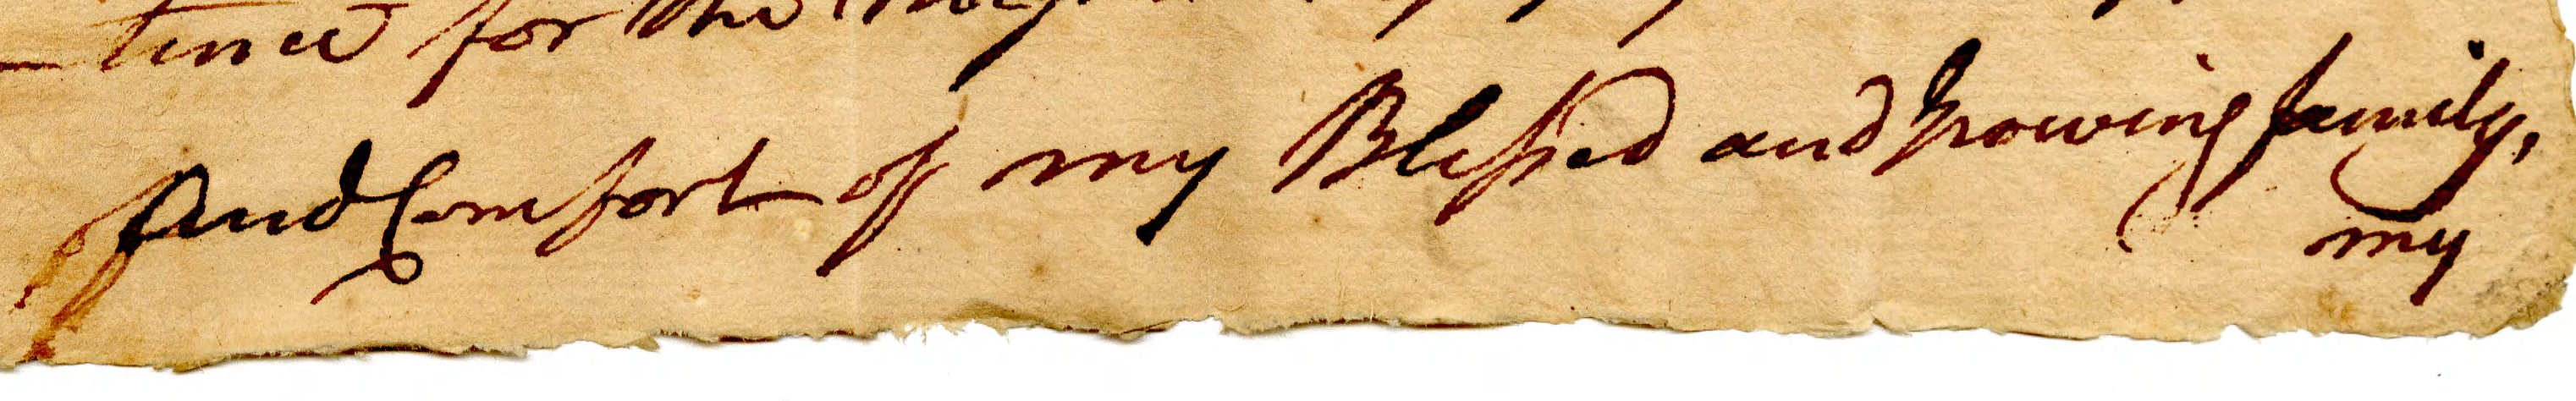and comfort of my Blessed and knowing family
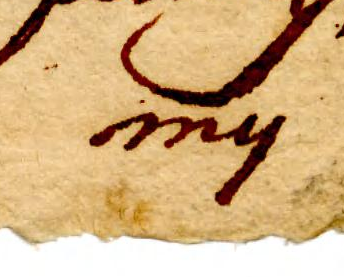my
